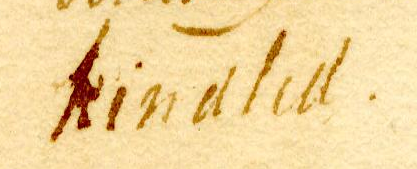kindled.
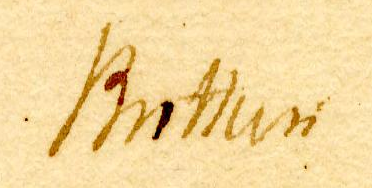Brothers
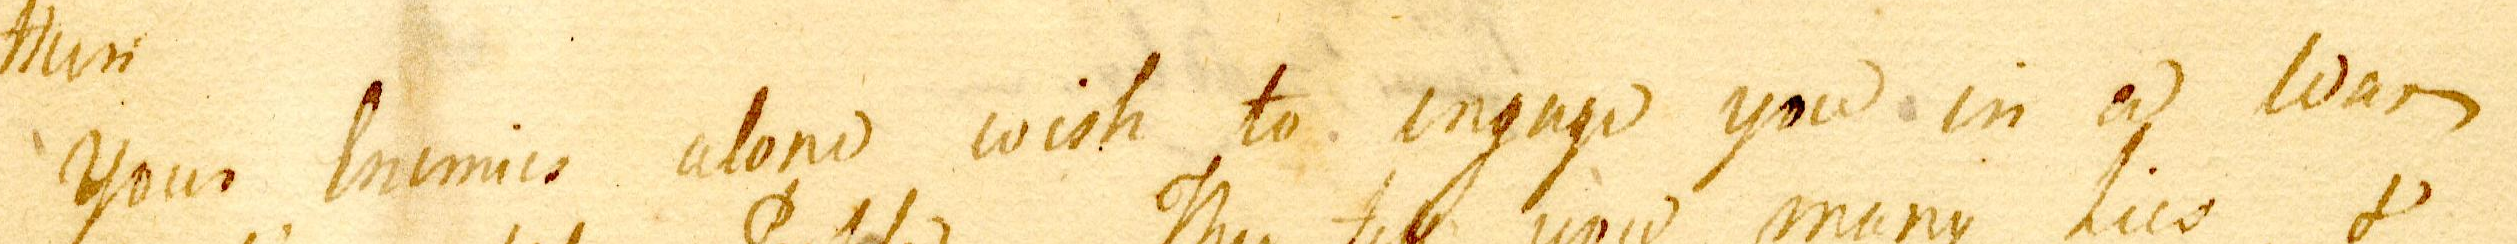Your Enemies alone wish to engage you in a War
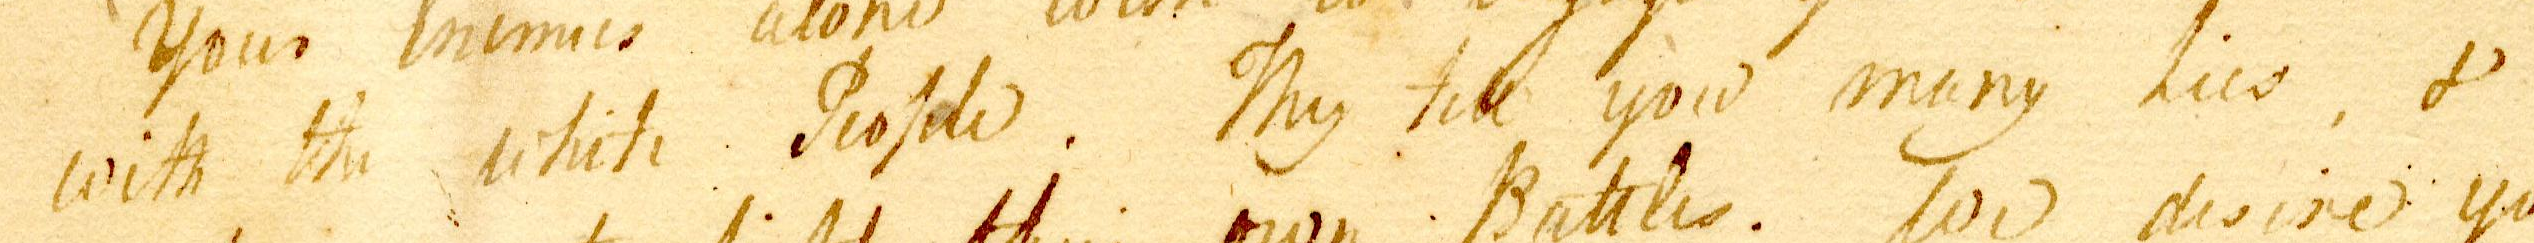with the white People. Thy tell you many Lies, &
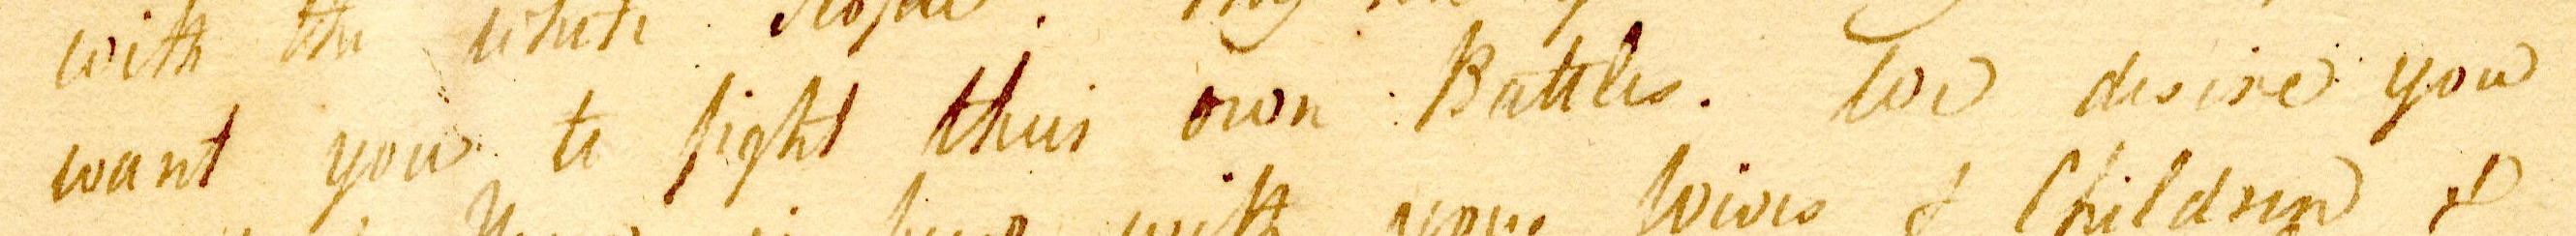want you to fight their own Battles. We desire you
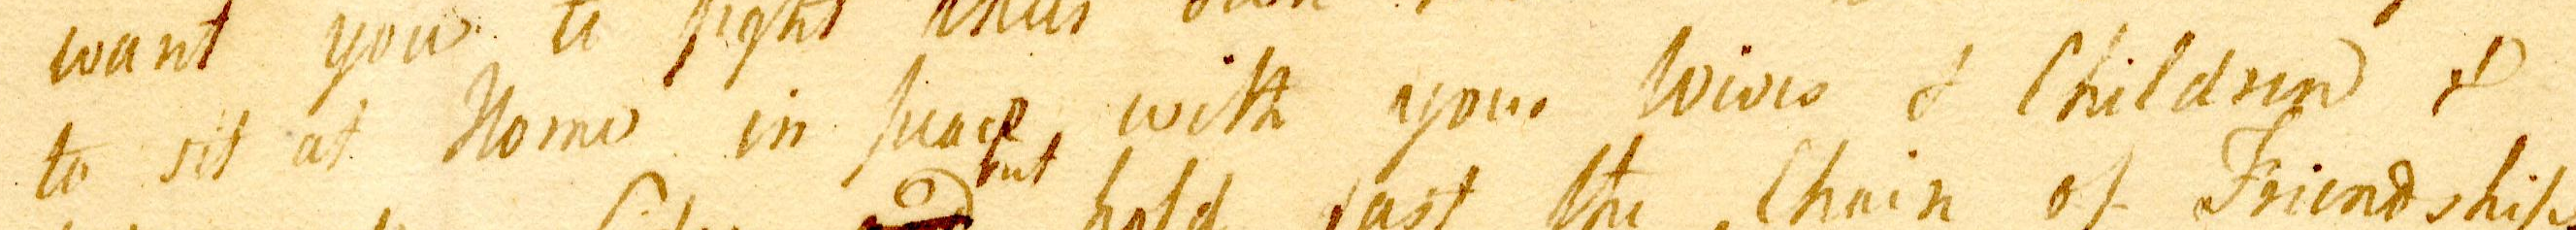to sit at Home in peace with your Wives & Children &
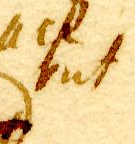but
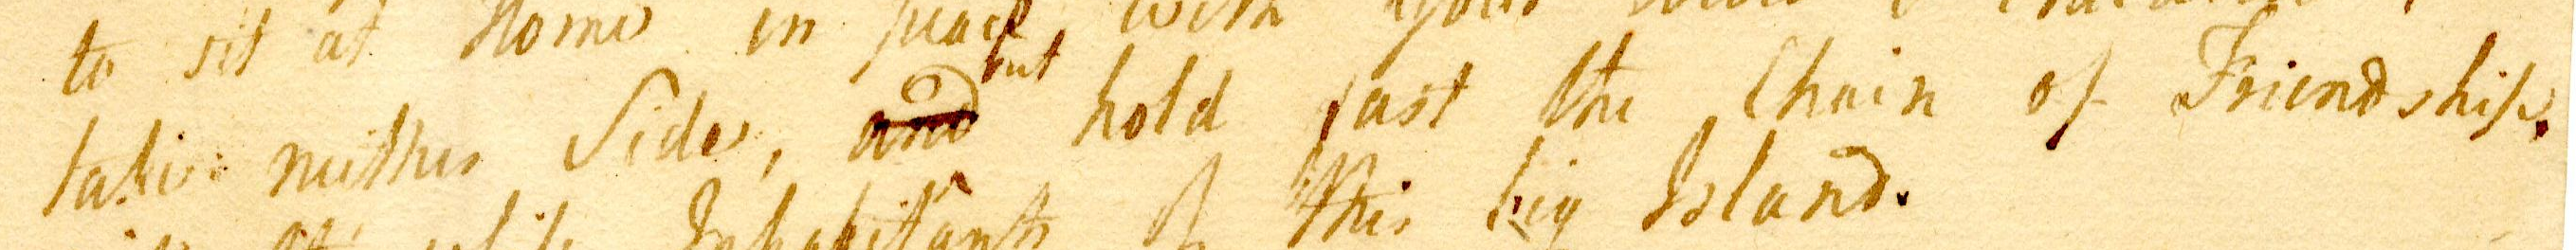take neither Side, [and] ^ hold fast the Chain of Friendship
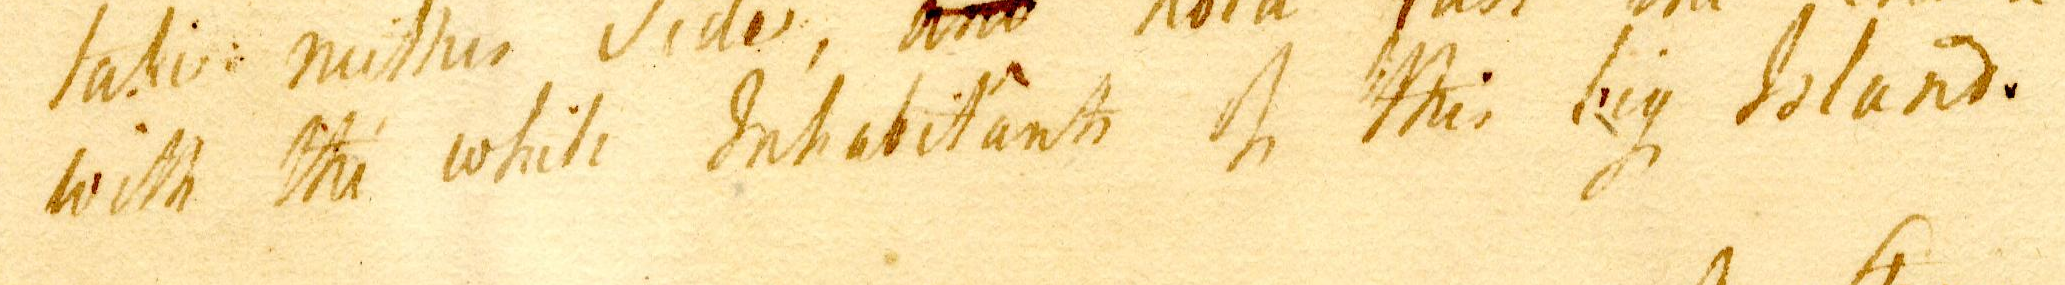with the white Inhabitants of this big Island.
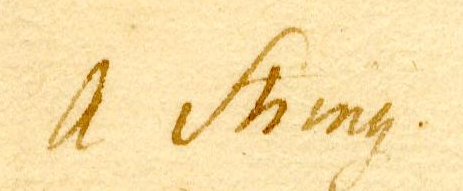A String-
